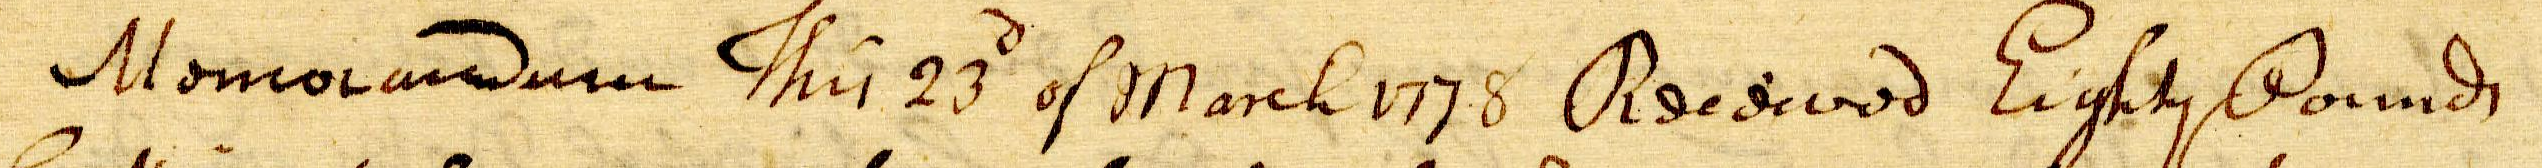Memorandum This 23^d of March 1778 Received Eighty Pounds
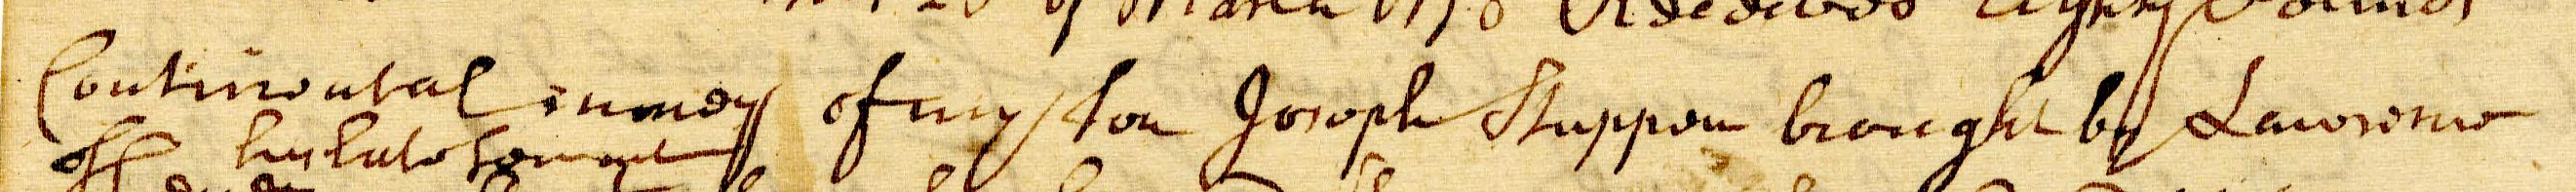Continental money of my son Joseph Shippen brought by Lawrence
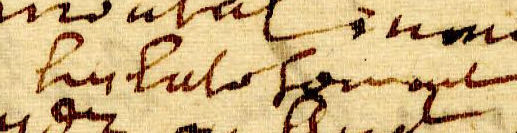his late servant
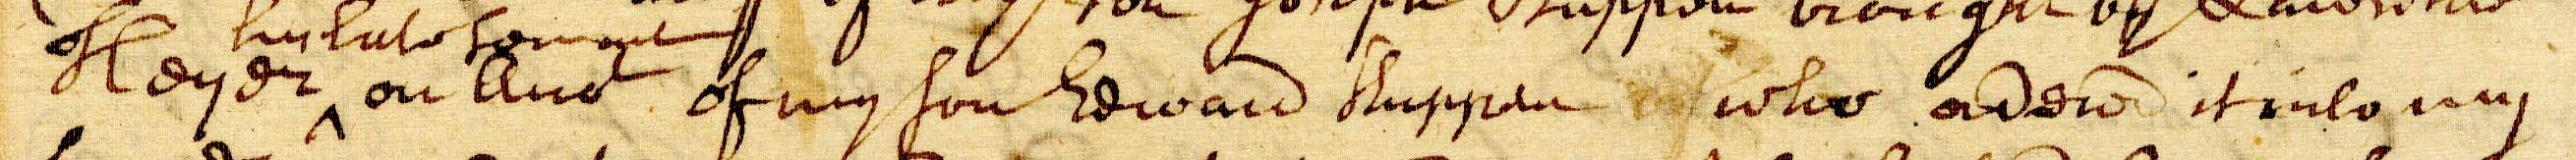Heyer ^ on Acco^t &f my son Edward Shippen who added it into my
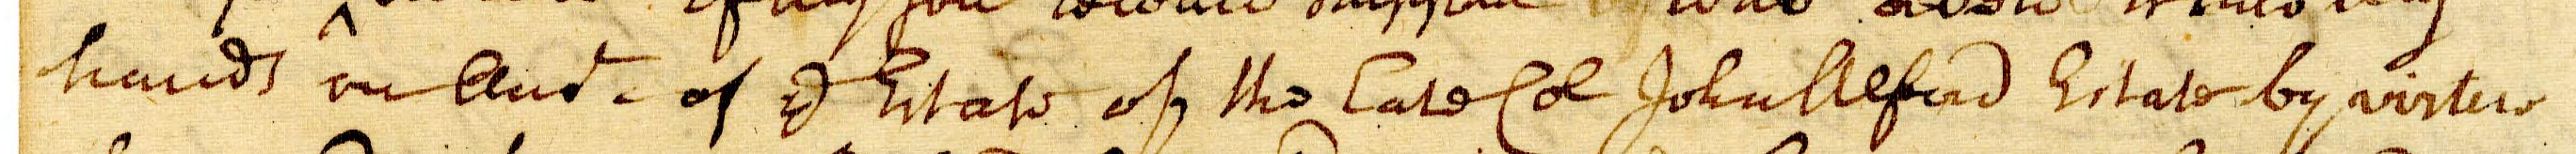hands on acco^t of y^e Estate of the late Col John Alford Estate by virtue
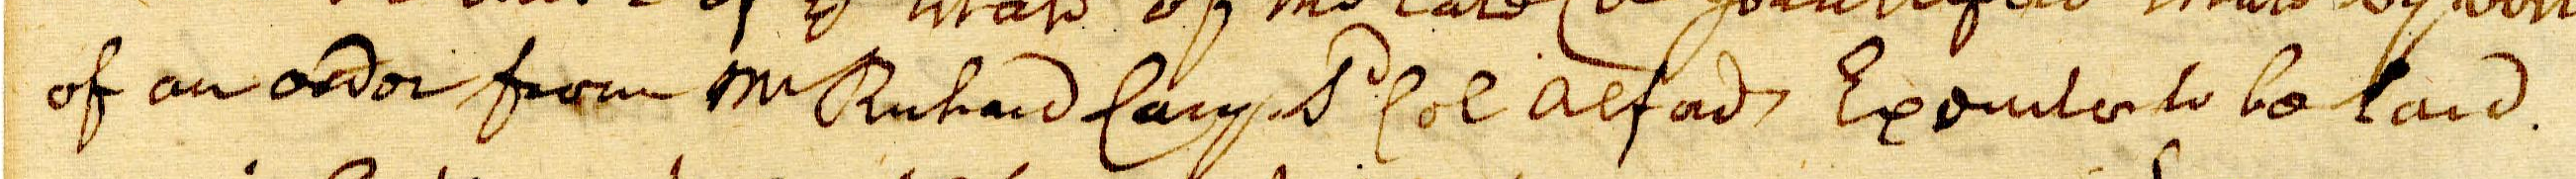of an order from M^r Richard Cary S^d Col Alfords Executor to be laid.
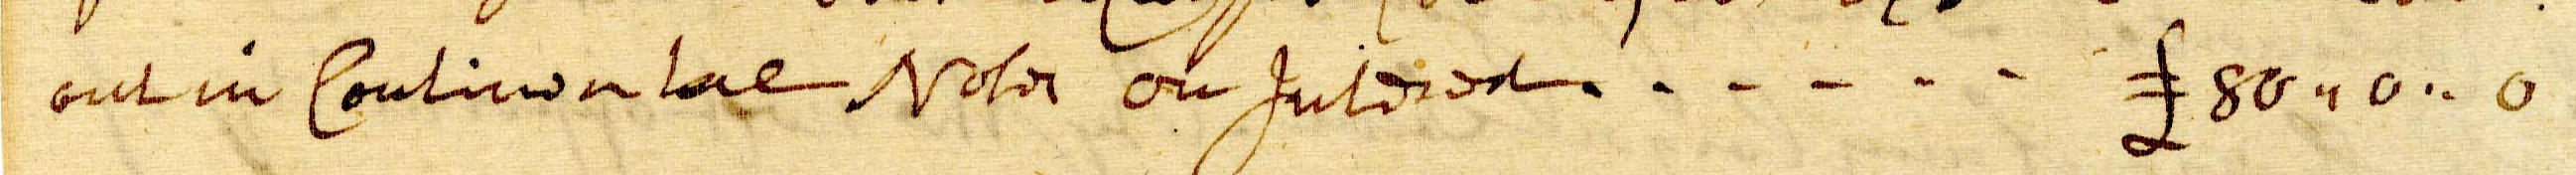out in Continental Notes on Interest...... £80..0..0
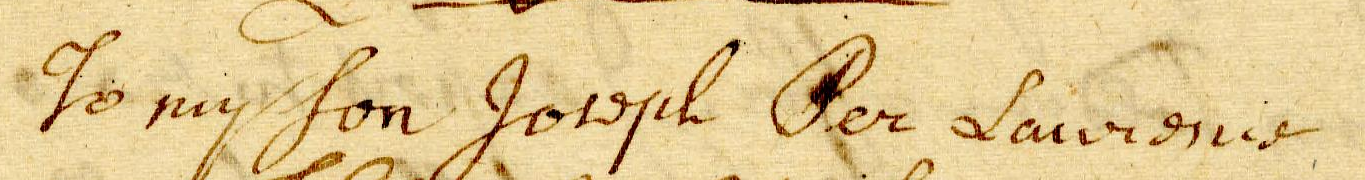To my Son Joseph Per Lawrence
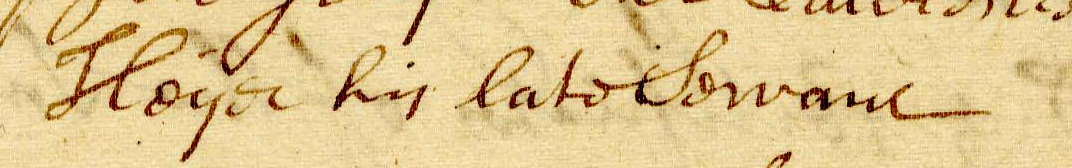Heyer his late Servant
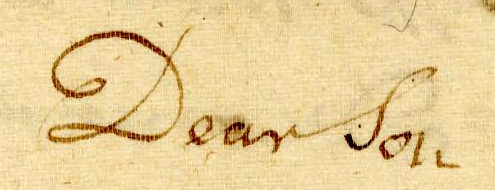Dear Son
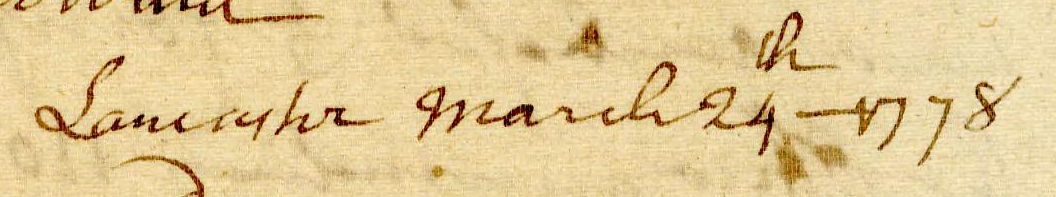Lancaster March 24^th- 1778
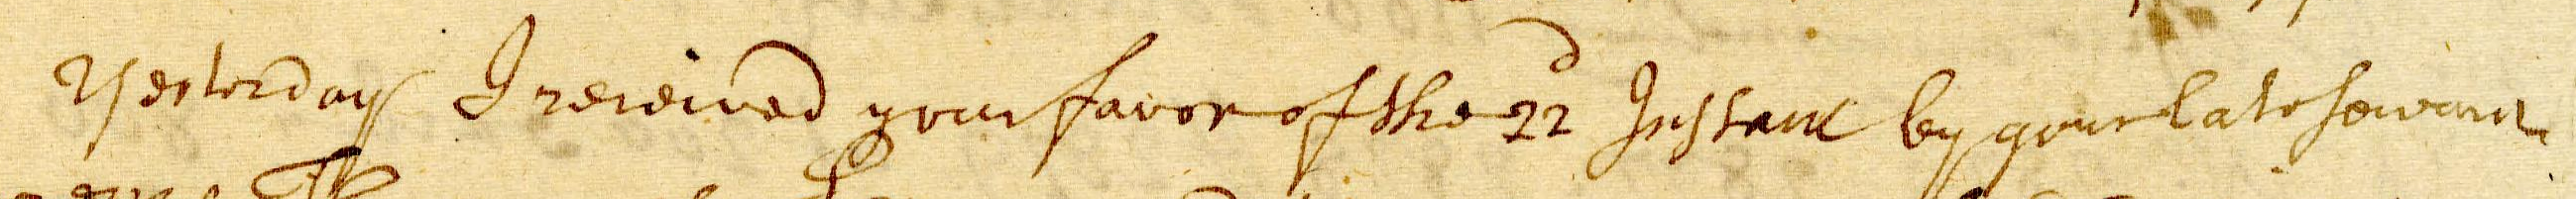Yesterday I received your favor of the 22^d Instance by your last forward
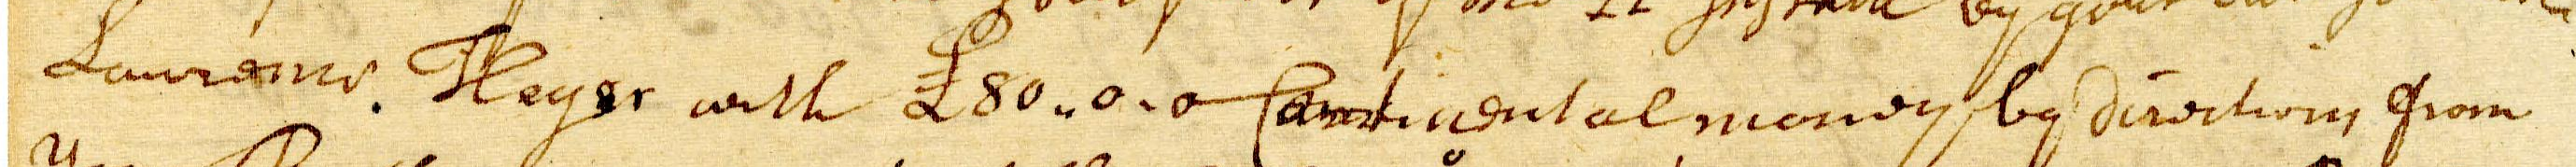Lawrence. Heyer with £80..0..0 Continental money by directions from
